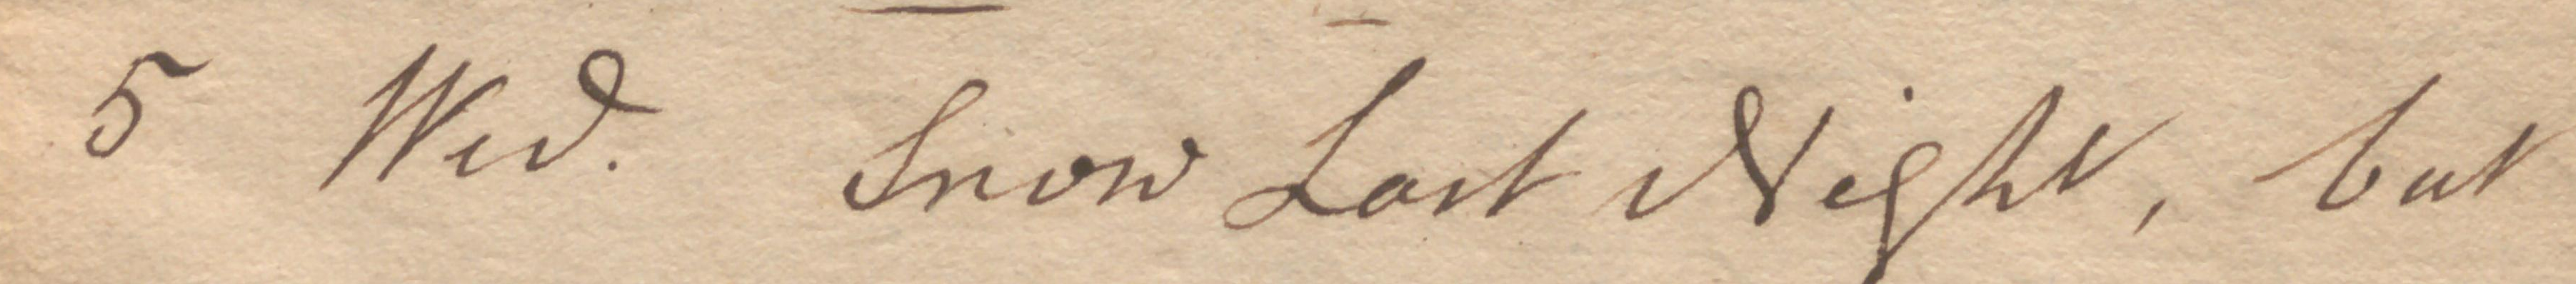5 Wed. Snow Last Night, but
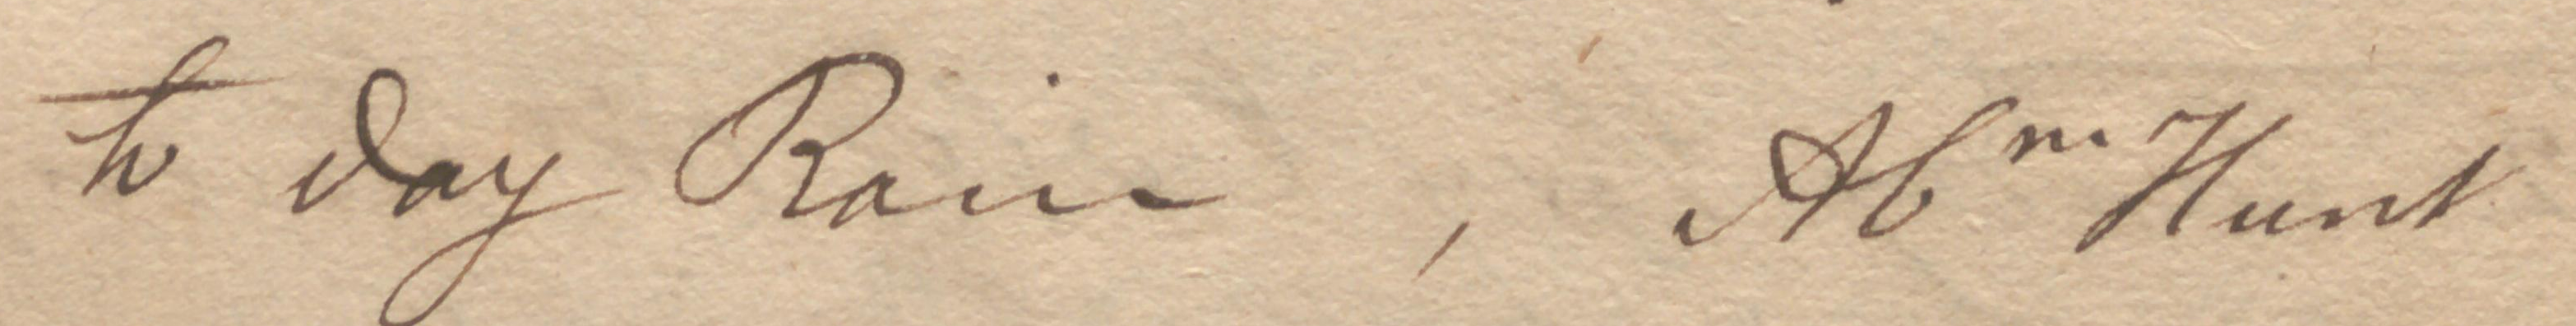to day Rain, Ab^m. Hunt
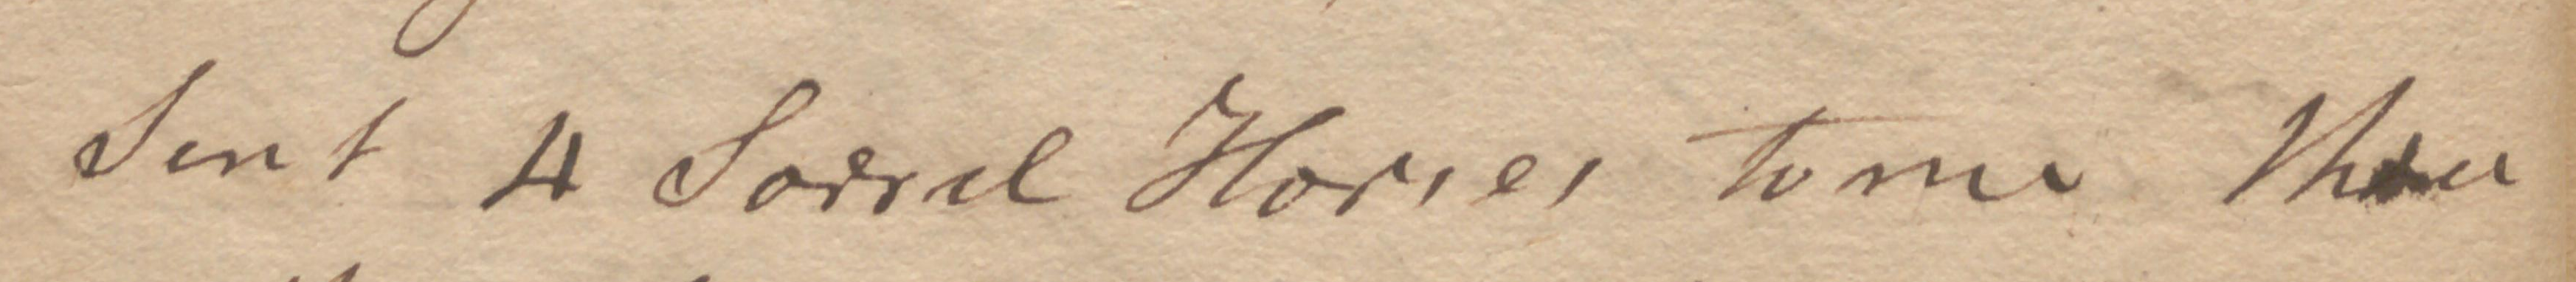Sent 4 Sorrel Horses to me three
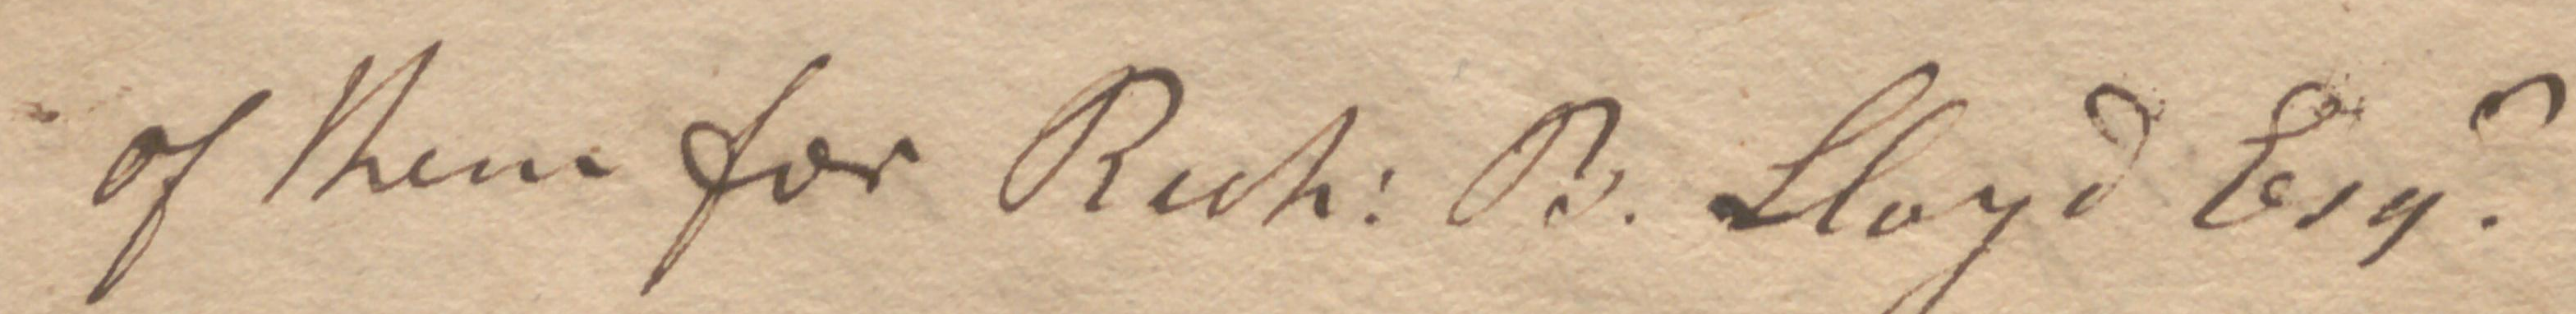of them for Rich: B. Lloyd Esq^r.
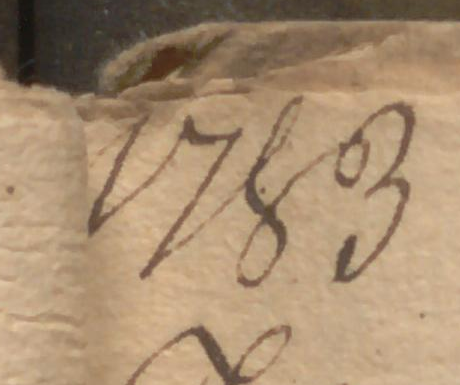1783
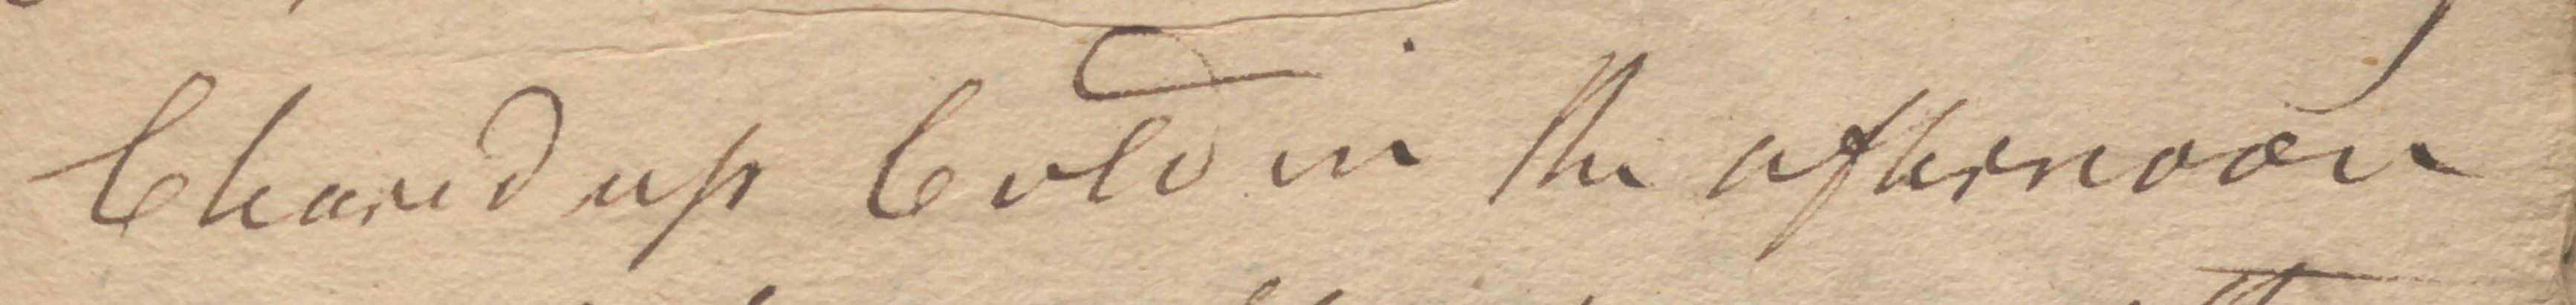Cleared up Cold in the afternoon
